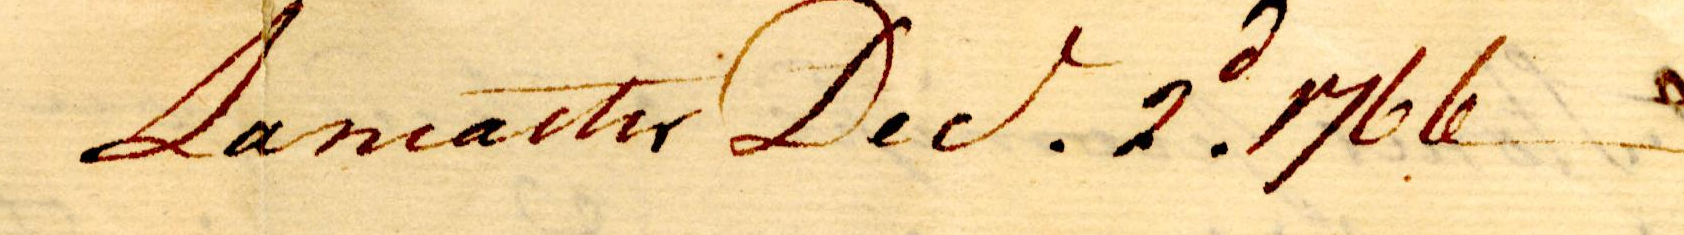Lancaster Dec^r. 2^d. 1766
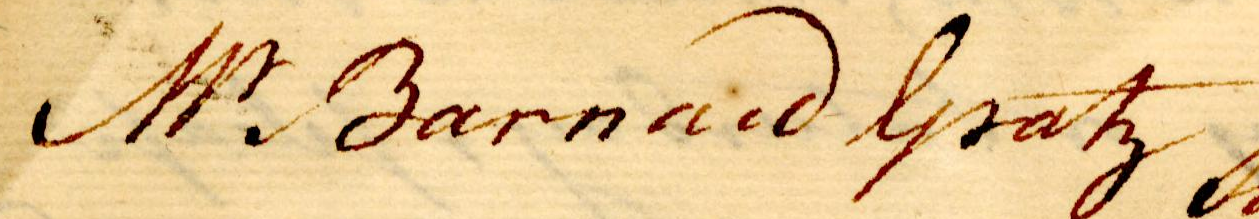M^r. Barnard Gratz
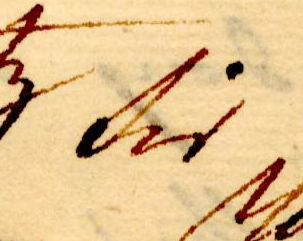Sir
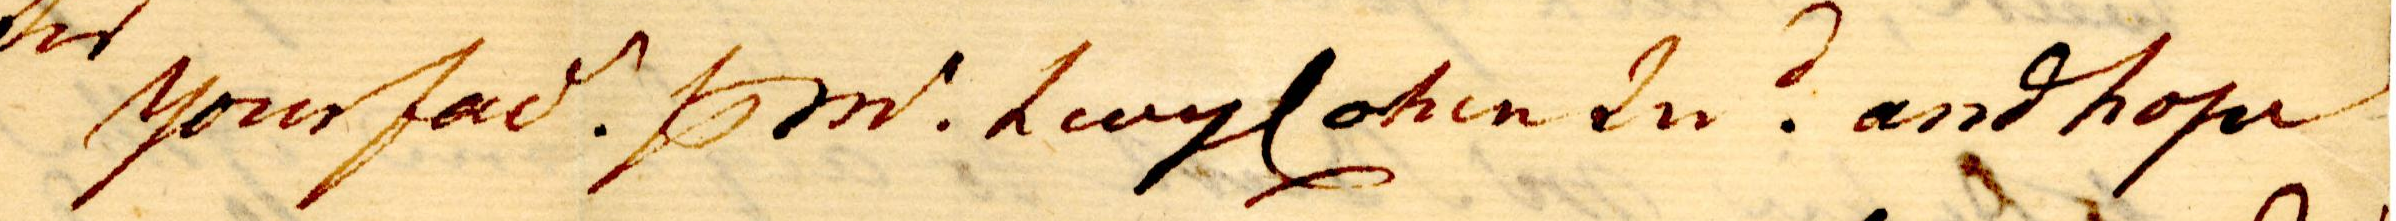Your fav^r. per m^r. Levy Cohen In^d. and hope
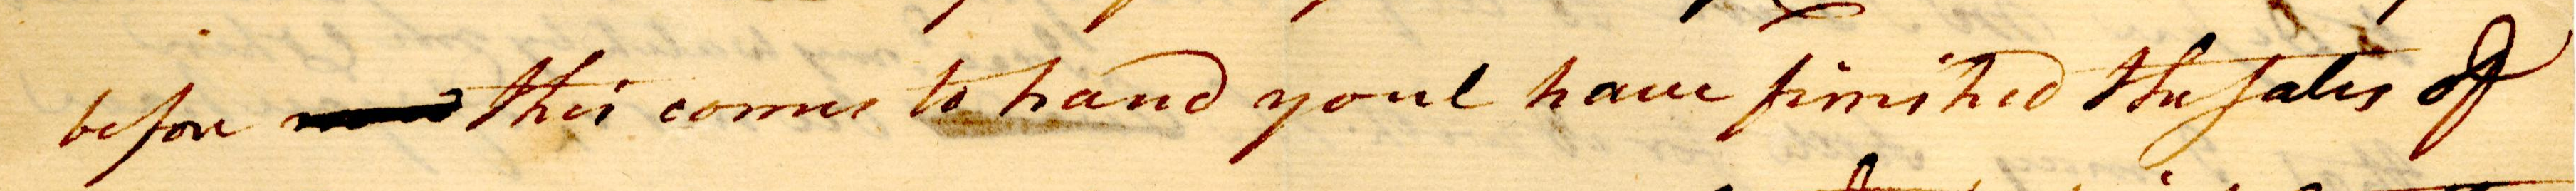before [___] this comes to hand youl have finished the sales of
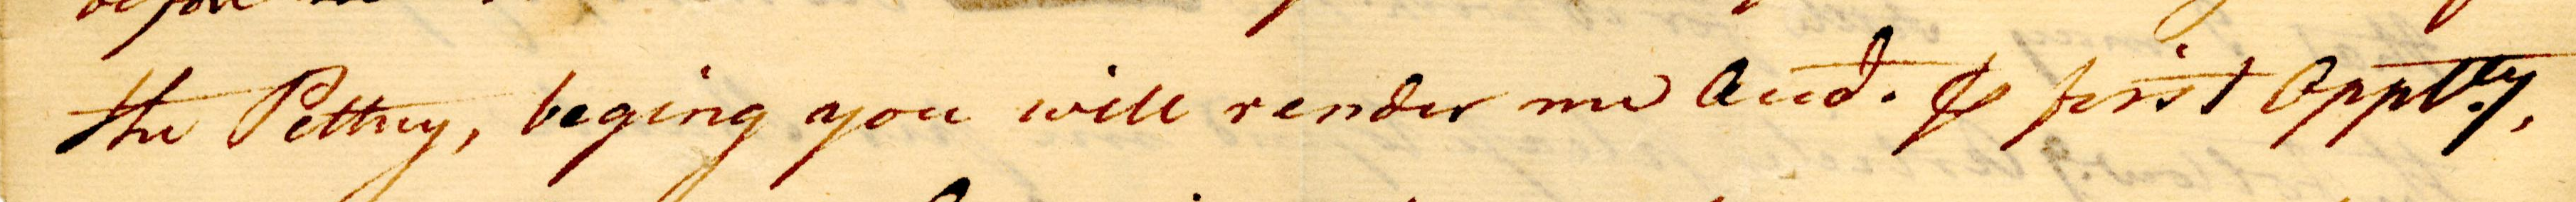the Peltry, beging you will render me acco^t. per first Opp^ty,
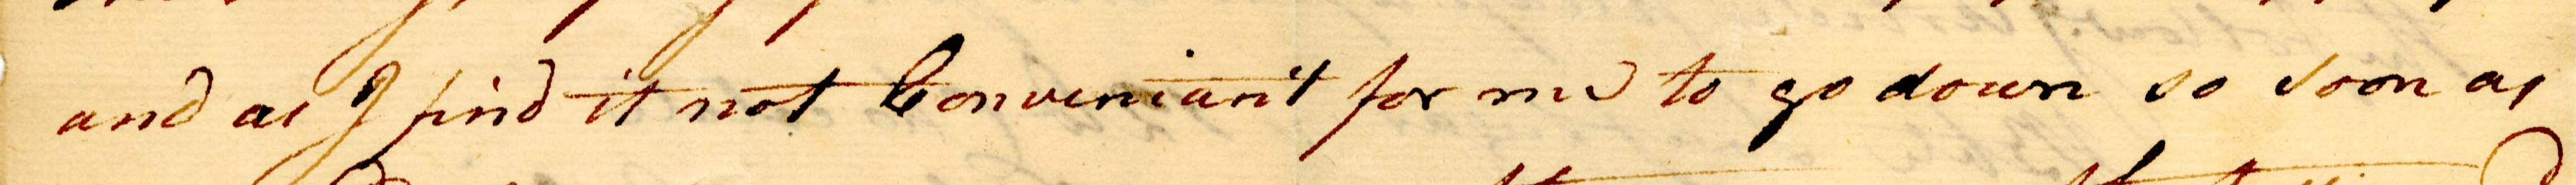and as I find it not Conveniant for me to go down so soon as
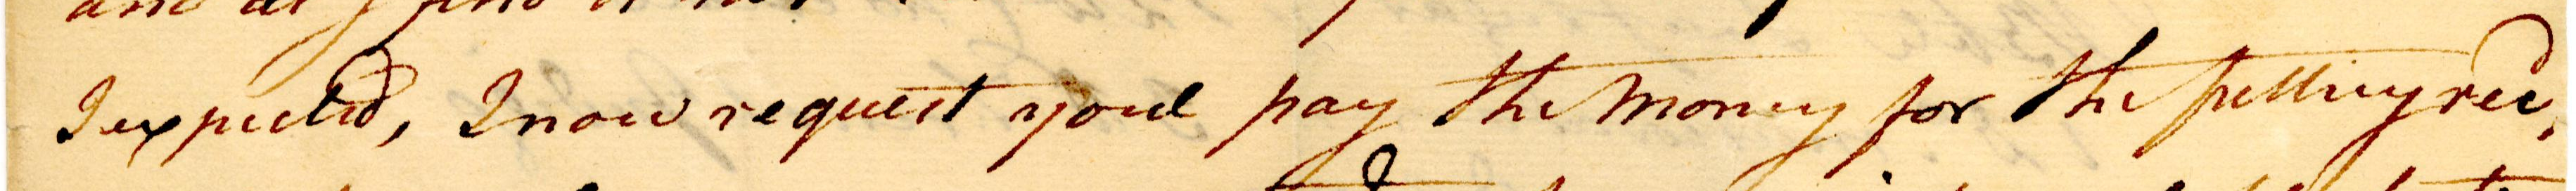I expected, I now request youl pay the money for the peltry rec^d
